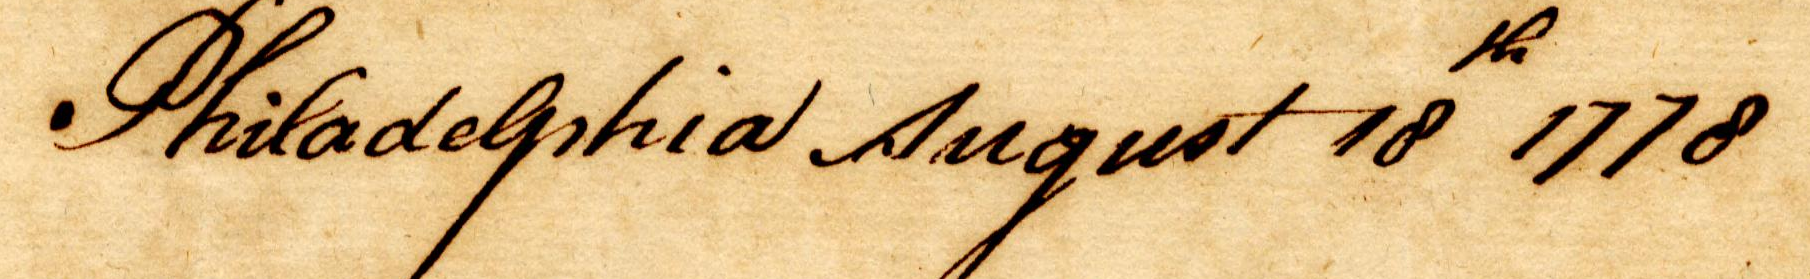Philadelphia August 18^th 1778
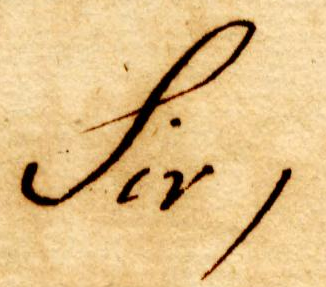Sir,
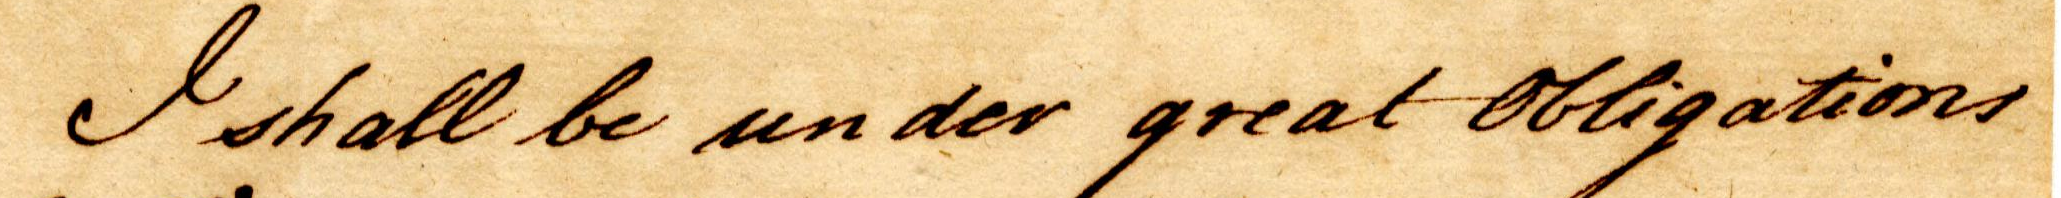I shall be under great Obligations
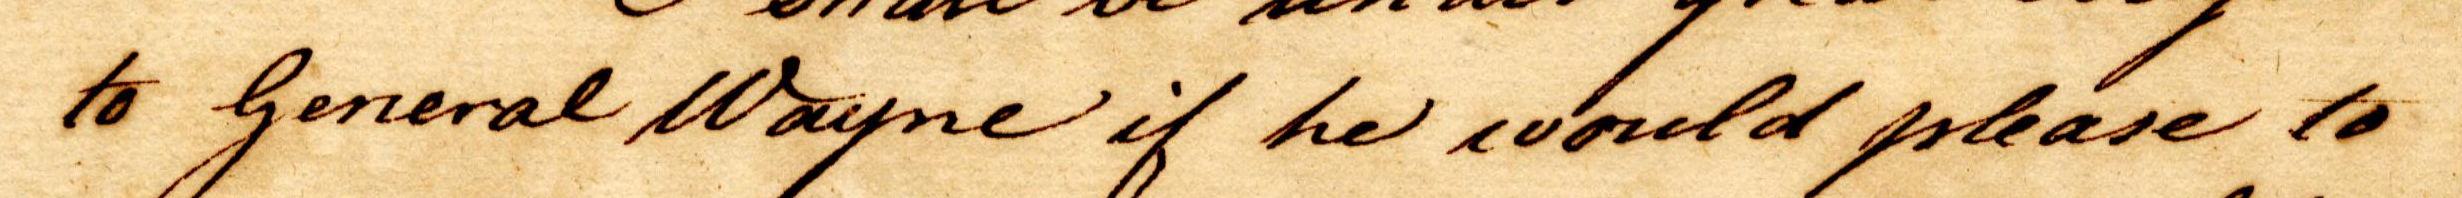to General Wayne if he would please to
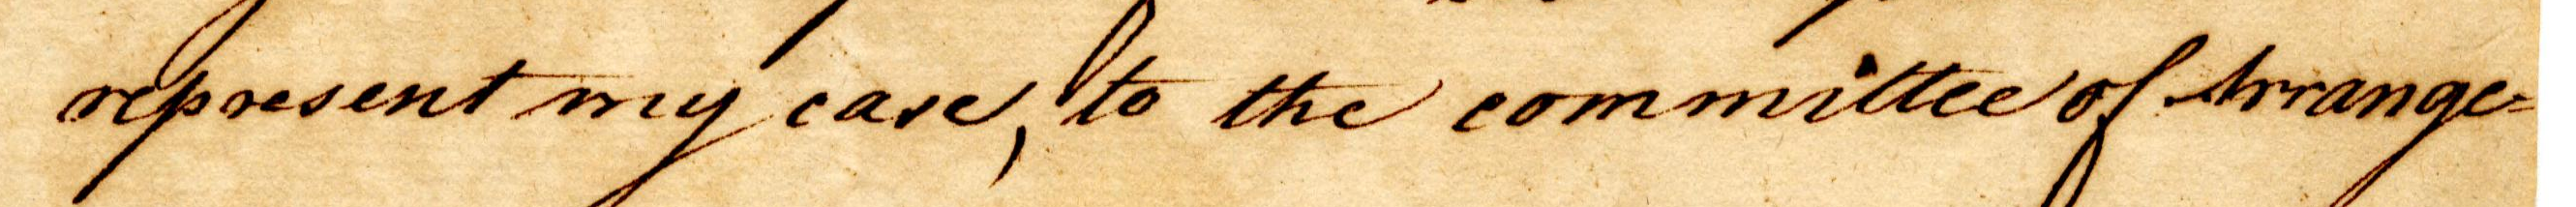represent my case, to the committee of Arrange-
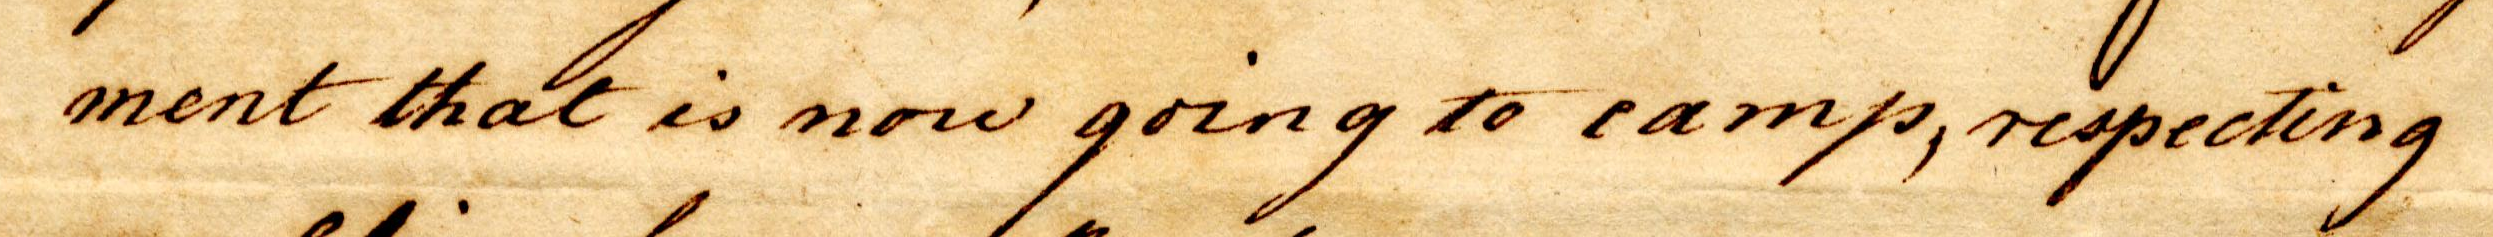ment that is now going to camp, respecting
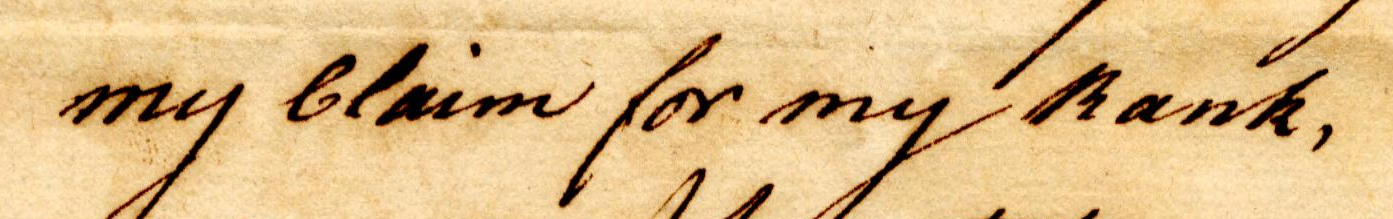my Claim for my Bank,
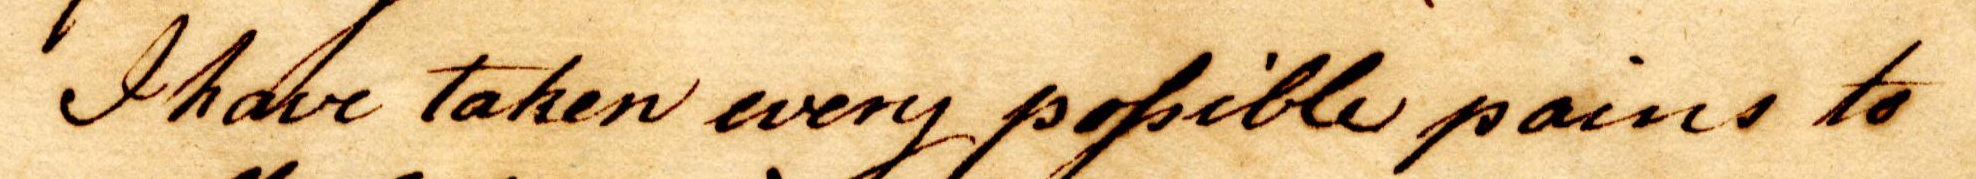I have taken every possible pains to
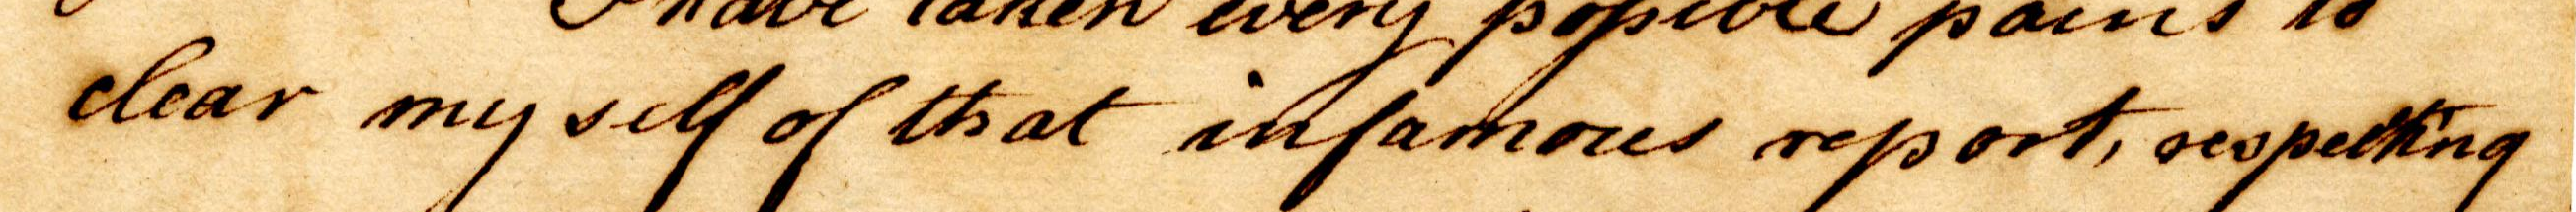clear myself of that infamous report, respecting
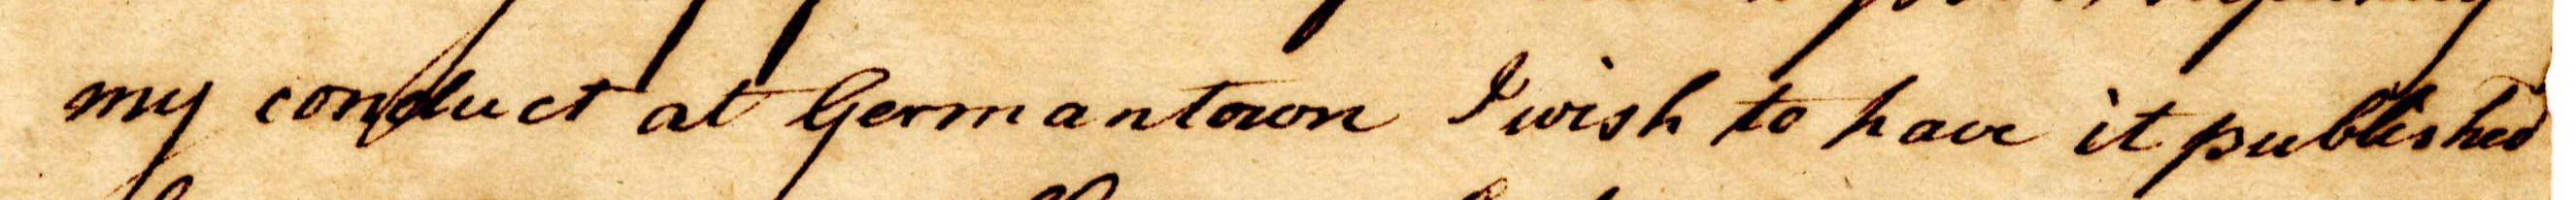my conduct at Germantown I wish to have it published
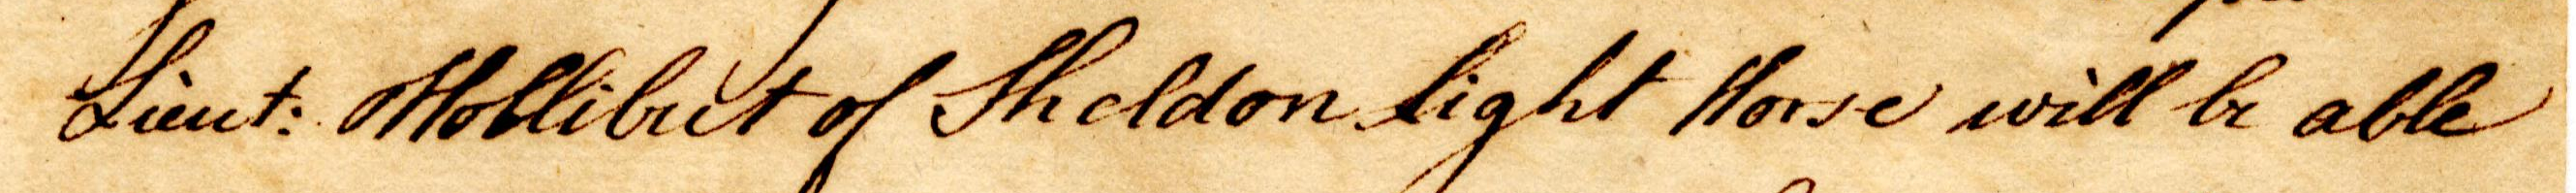Lieut: Hoblibut of Sheldon light Horse will be able
